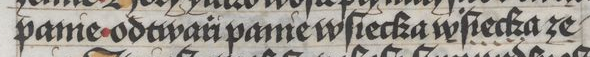panie.odtwaṙi panie wſiecka wẛiecka ze¬
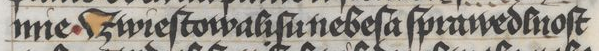mie.Zwieſtowaliſu nebeſa ſprawedlnoſt
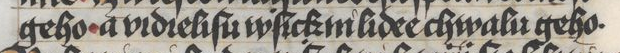geho.a vidieliſu wẛickni lidee chwalu geho.
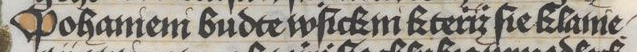Pohanieni budte wẛickni kteṙiż ſie klanie¬
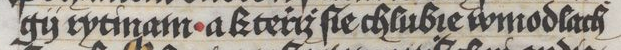gij rytinam.a kteṙiż ſie chlubie wmodlach
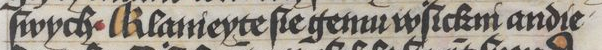ſwych.Klanieyte ſie gemu wẛickni andie¬
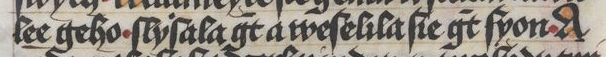lee geho.ſlyẛala ḡt a weſelila ſie ḡt ſyon.A
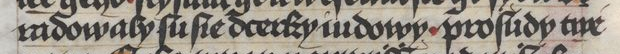radowaly ſu ſie dcerky iudowy.proſudy twé
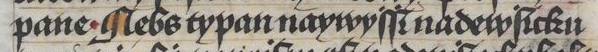pane.Nebs ty pan naywyẛẛi nadewẛicku
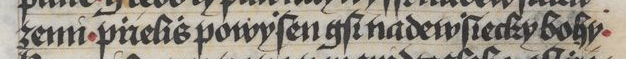zemi.pṙieliṡ powyẛen gſi nadewẛiecky bohy.
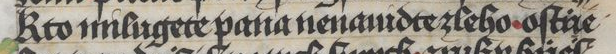Kto milugete pana nenauidte zleho.oſtṙie¬
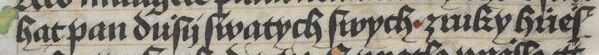hat pan duẛij ſwatych ſwych.zruky hṙieẛ¬
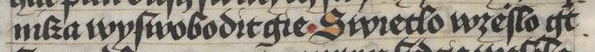nika wyſwobodit gie.Swietlo wzeẛlo ḡt
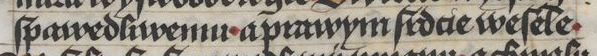ſpawedliwemu.a prawym ſrdcie weſele.
